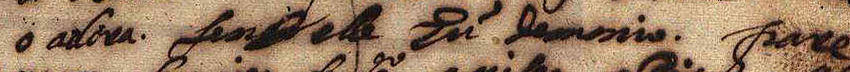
o adora. sendo elle hū demonio. pare
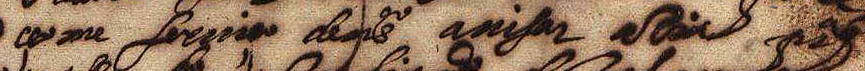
ceo me seruiço de n sor auisar a vm pro q̄
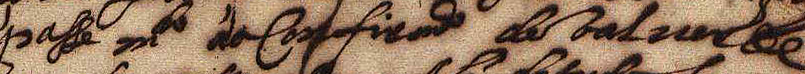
passe mdo ao Confirmdo de valuerde
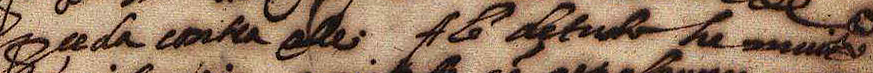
ꝓceda contra elle. Alē de tudo he muito
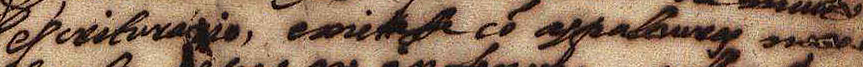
escriturario, e mettesse cō as palauras n
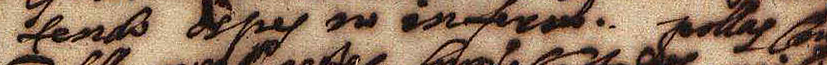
tendo os pes no inferno. pollas Cousas
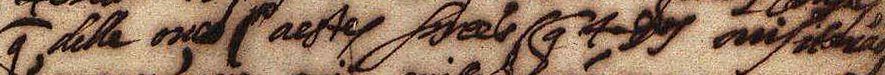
q̄ delle ouço ( a estes snres̄ ) q̄ todos o uisitaraõ
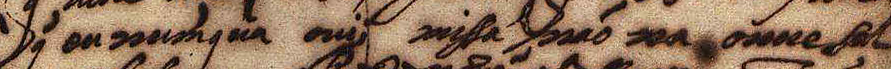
q̄ eu numqua o ui missa naõ na ouue sal
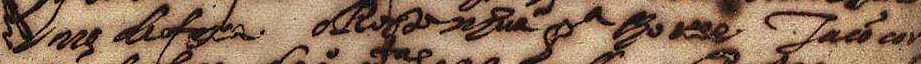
uo de fora. o Rosto nhuā pa lho uee Ja cōcor
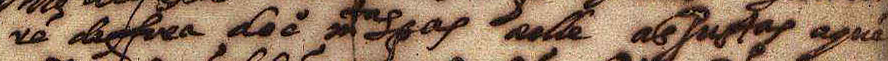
rē de fora do co mtas pas a elle as Justas a quē
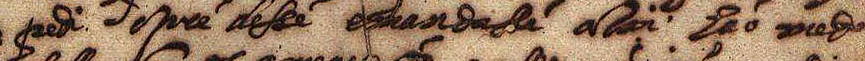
pedi o prēdessē e mandassē a Vm haõ medo
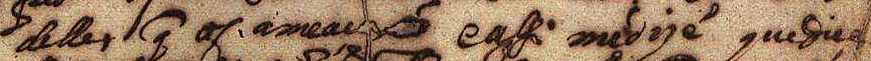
delle, q̄ os ameaça e assi me dizē que dice
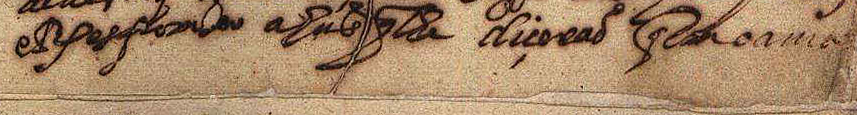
e Rꝭespondeo a hus̄ q̄ lhe diceraõ q̄ mo auiao
